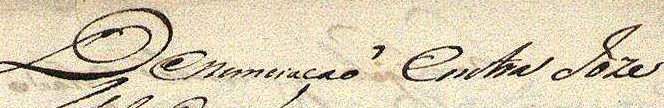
Denunciaçaõ Contra Joze
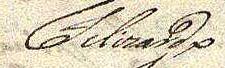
Felizardo
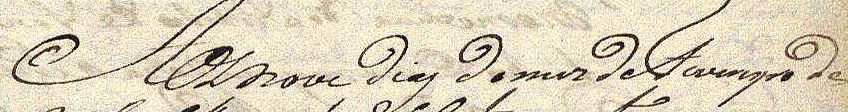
Aoz nove dias do mez de Fevereyro de
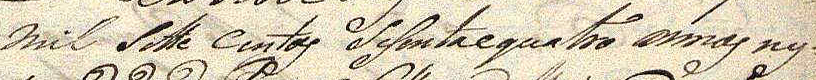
mil setteCentos sesenta e quatro annos nes
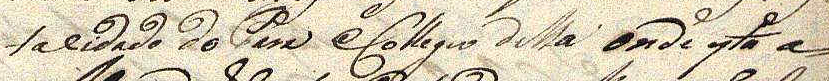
ta cidade do Para e Collegio della onde esta a
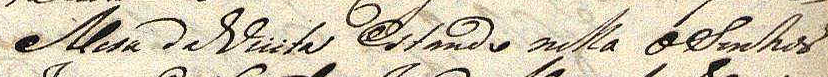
Mesa da Visita Estando nella o Senhor
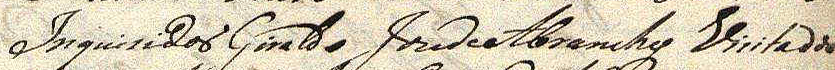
Inquizidor Giraldo Joze de Abranches Visitador
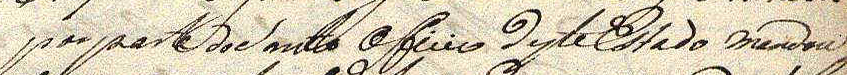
por parte do Santo Officio deste Estado mandou
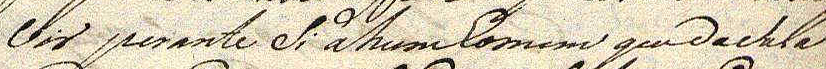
vir perante Si a hum homem que da Sala
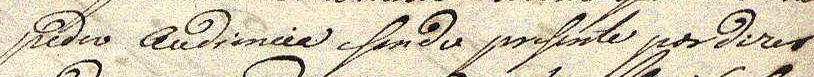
pedio audiencia, sendo presente por dizer
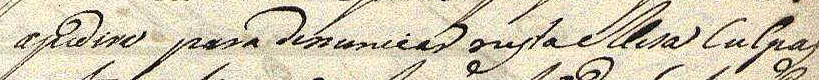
a pedira para denunciar nesta Mesa Culpas
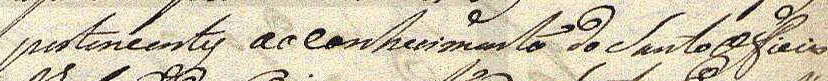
pertencentes ao conhecimento do Santo Officio
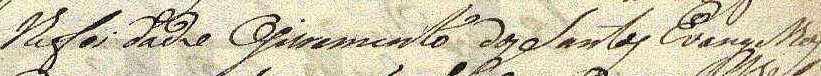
lhe foi dado O juramento dos Santos Evangelhos
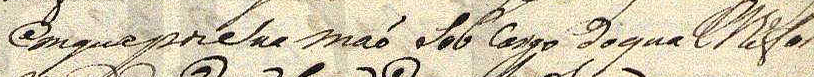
Em que pos sua maõ Sob Cargo do qual lhe foi
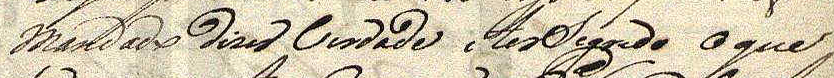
mandado dizer Verdade e ter Segredo o que
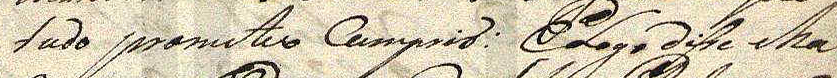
tudo prometeo Cumprir: E Logo disse cha
